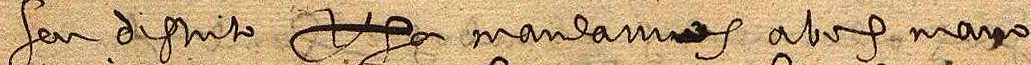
seu distrito c̄ꝭa mandamos a vos mano
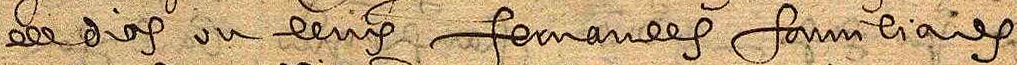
ell dias ou lluis fernandes familiares
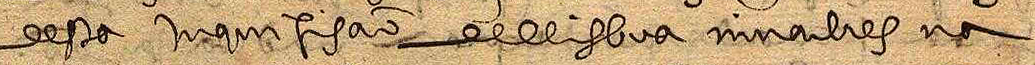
desta Inquisisaõ de llisboa moradores na
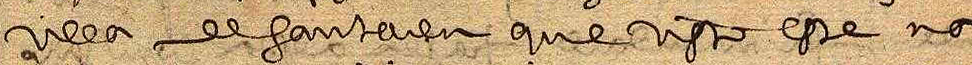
villa de santaren que visto este na
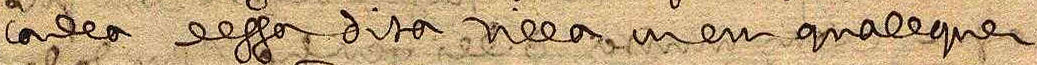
cadea dessa dita villa ou em quallquer
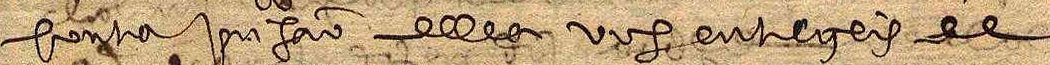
houtra prisaõ della vos entregeis de
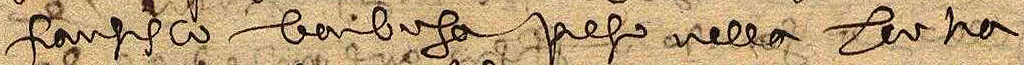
fransisco barbosa preso nella he o tra
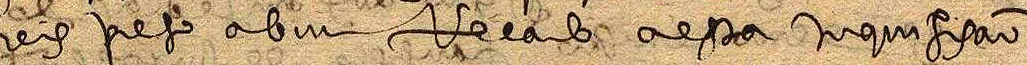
reis preso a bon Recado a esta Inquisisão
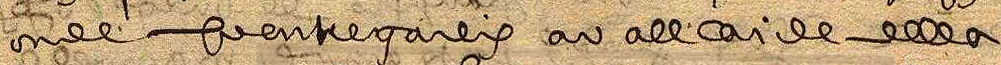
onde ho entregareis ao allcaide della
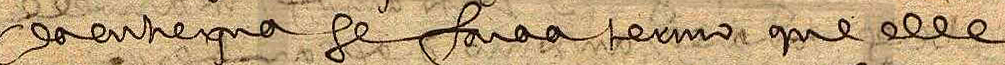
e da entregua se faraa termo que elle
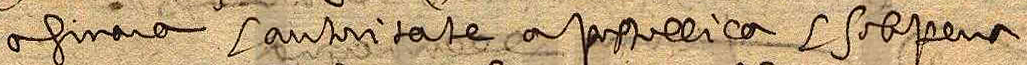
asinara E autoritate apostollica E sob pena
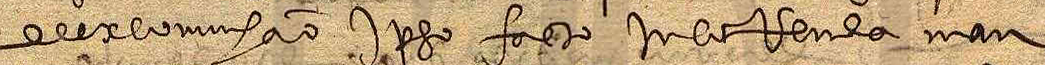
de excomunhaõ Jpso facto JncoRenda man
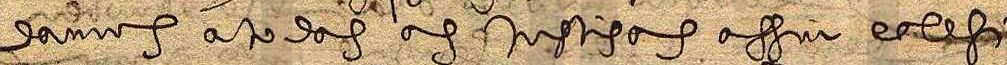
damos a todas as Justisas assin eclesi
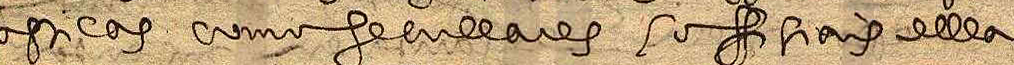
asticas como secullares E offisiais della
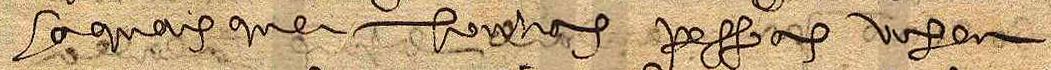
E a quaisquer houtras pessoas vos en
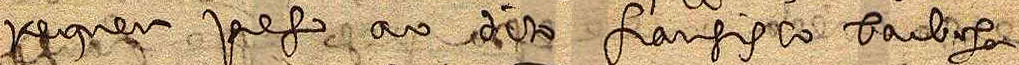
treguen preso ao dito fransisco barbosa
